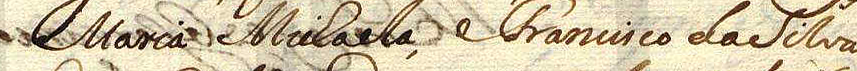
Maria Michaela, e Francisco da Silva,
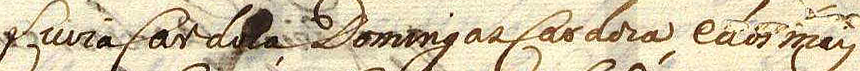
Luiza Cardoza, Domingas Cardoza, e dos mais
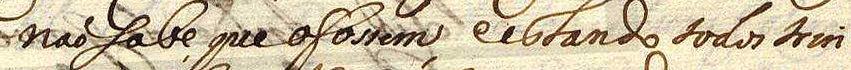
naõ sabe, que o fossem, e estando todos trin
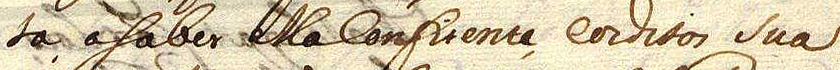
ta, a saber ella Confitente, e os ditos sua
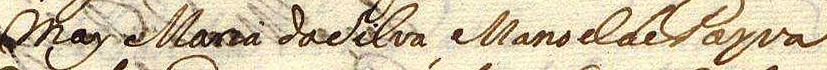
may Maria da Silva, e Manoel de Payva
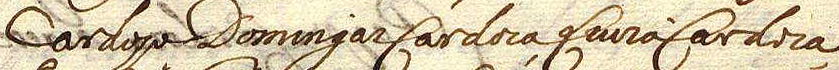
Cardoso Domingas Cardoza, Luiza Cardoza,
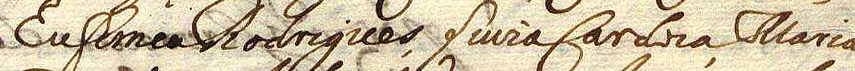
Eufemea Rodrigues, Luiza Cardoza, Maria
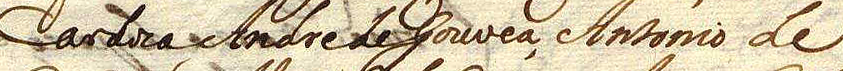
Cardoza, Andre de Gouvea, Antonio de
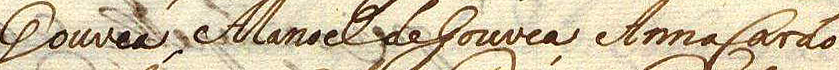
Gouvea, Manoel de Gouvea, Anna Cardo
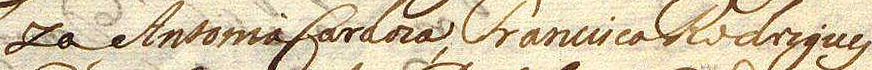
za, Antonia Cardoza, Francisco Rodrigues,
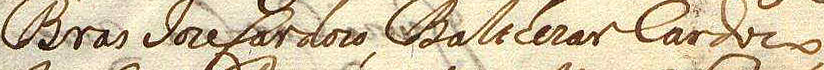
Bras Ioze Cardozo, Balthezar Cardozo,
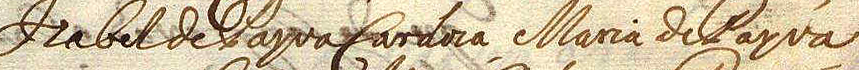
Izabel de Payva Cardoza, Maria de Payva,
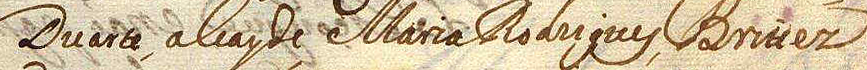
Duarte, alcayde, Maria Rodrigues, Brittez
